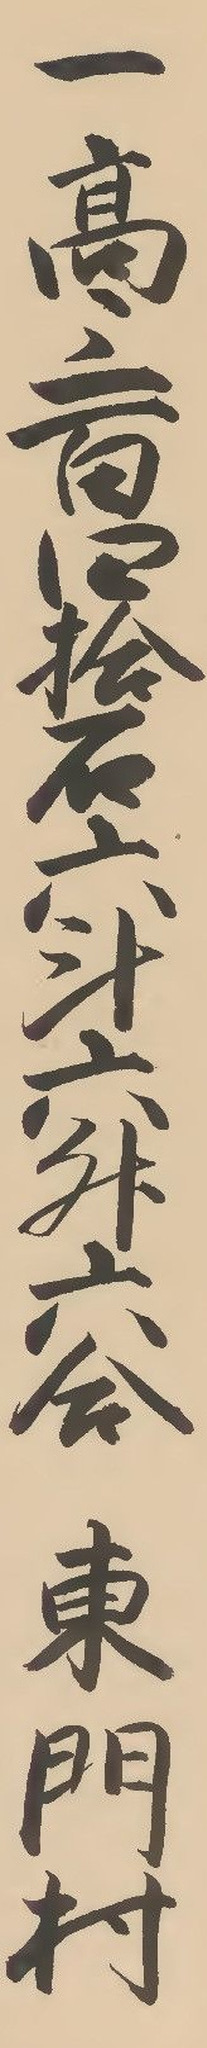一高三百四拾石六斗六升六合東門村
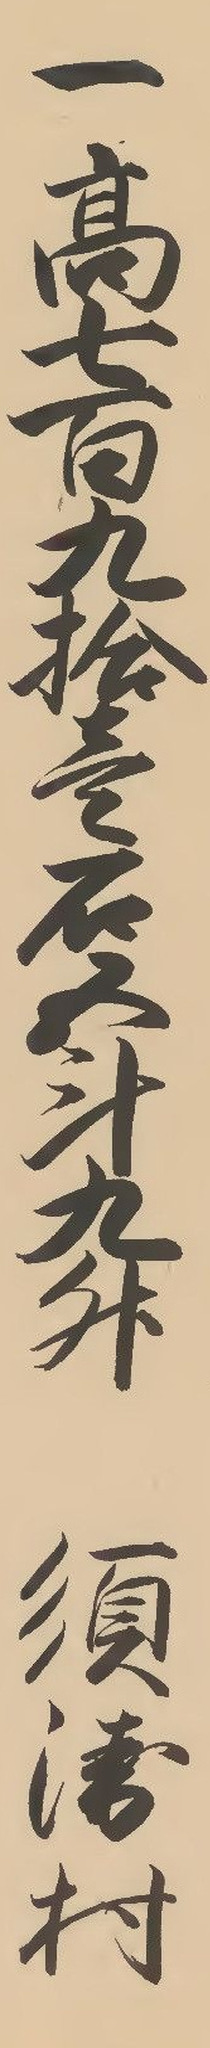一高七百九拾壱石五斗九升須衛村
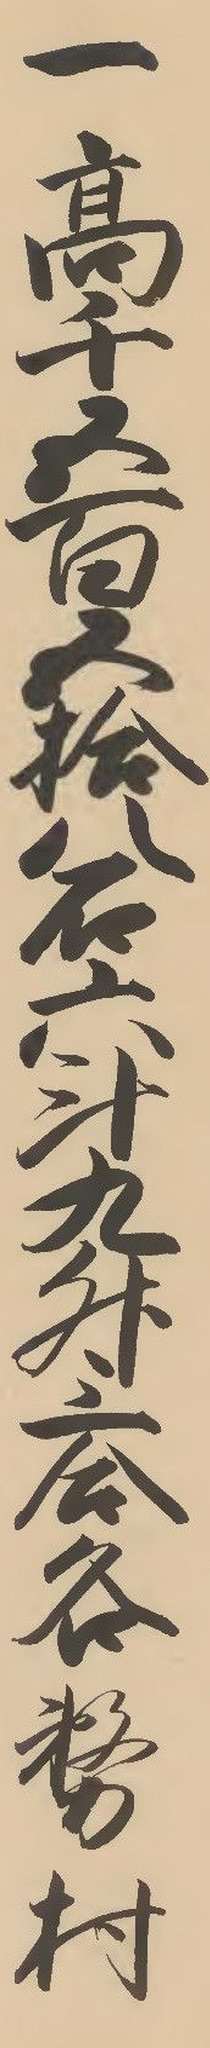一高千五百五拾八石六斗九升三合各務村
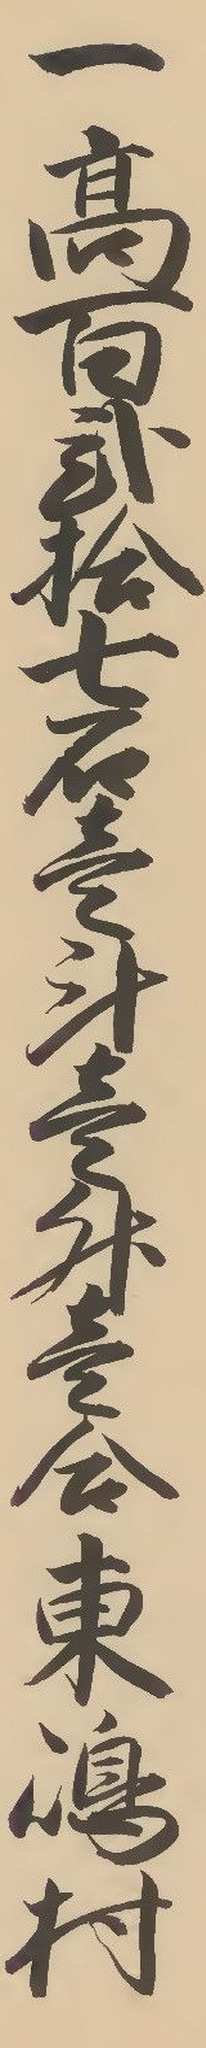一高百弐拾七石壱斗壱升壱合東島村

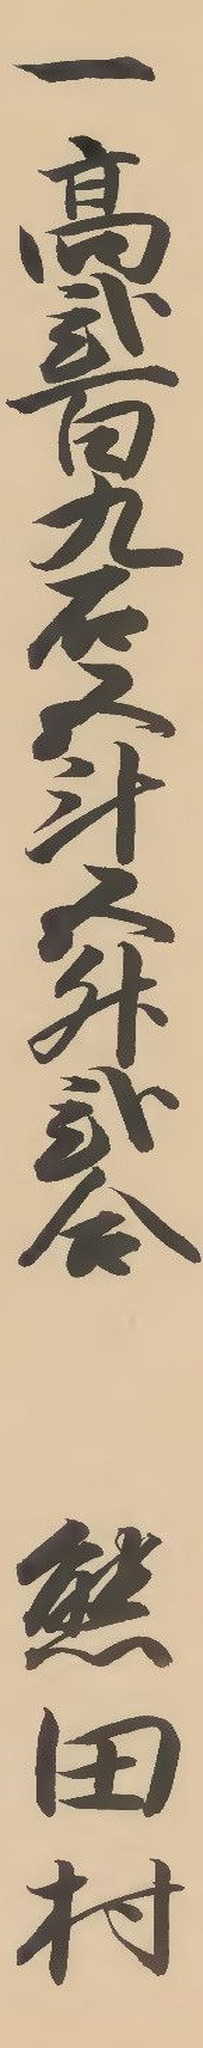一高弐百九石五斗五升弐合熊田村
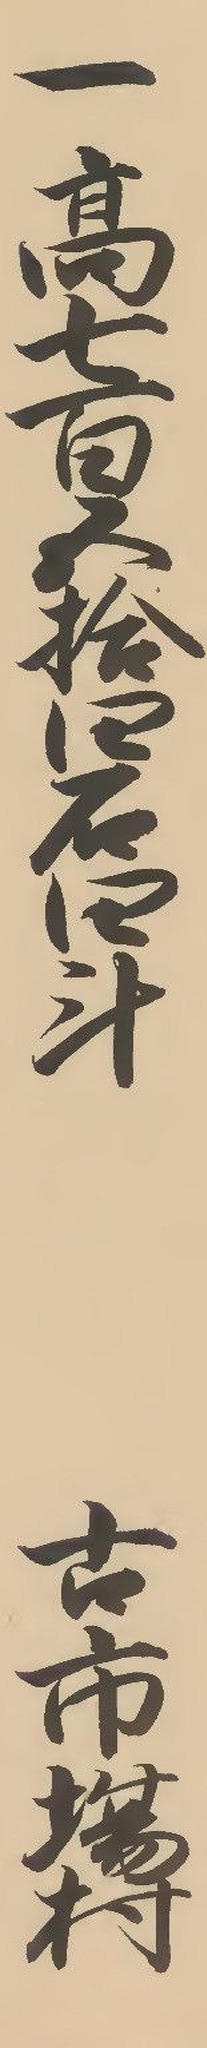一高七百五拾四石四斗古市場村
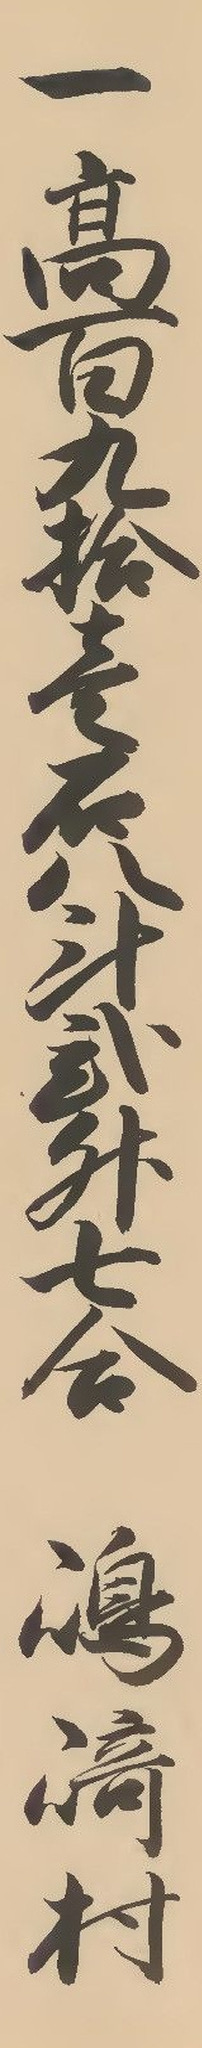一高百九拾壱石八斗弐升七合島崎村
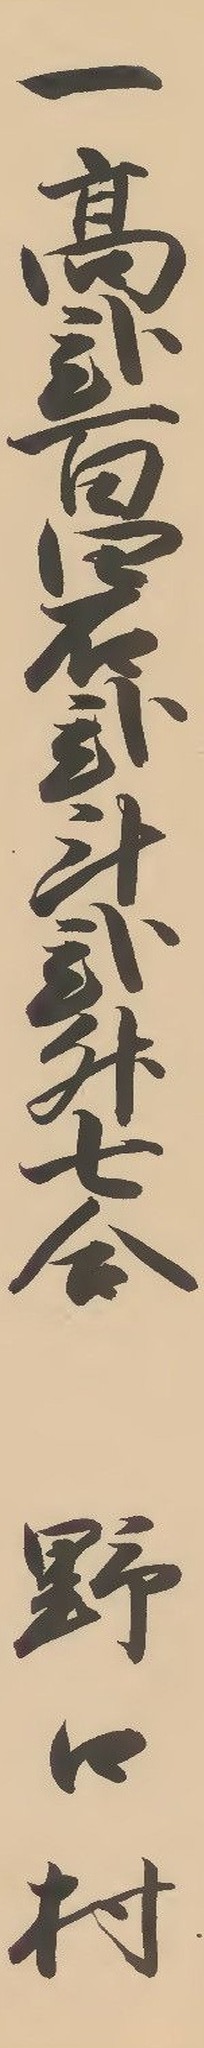一高弐百四石弐斗弐升七合野口村
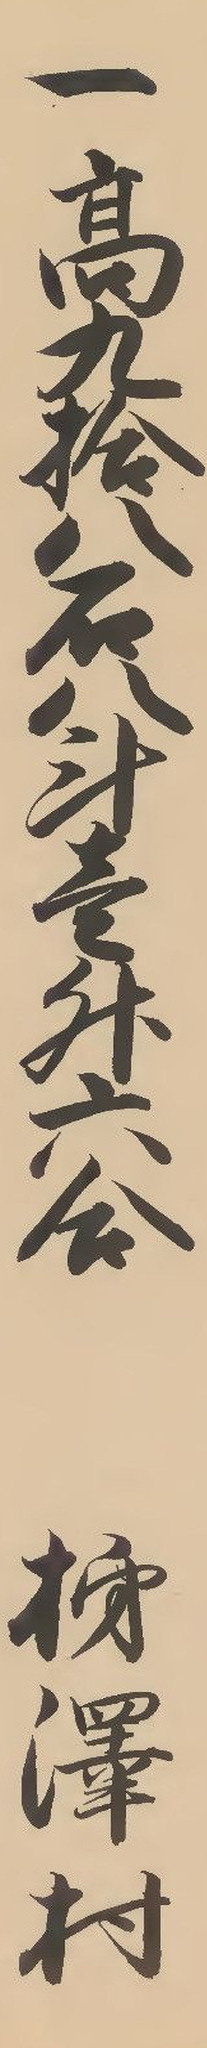一高九拾八石八斗壱升六合柿沢村
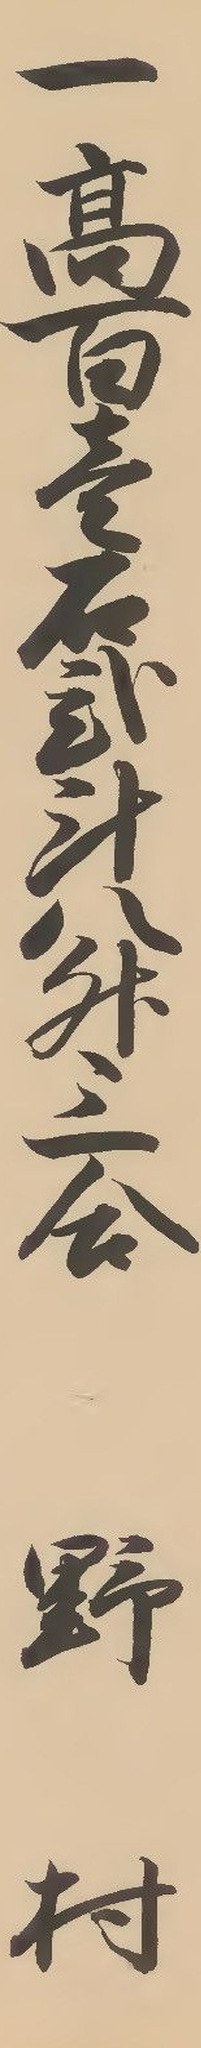一高百壱石弐斗八升三合野村
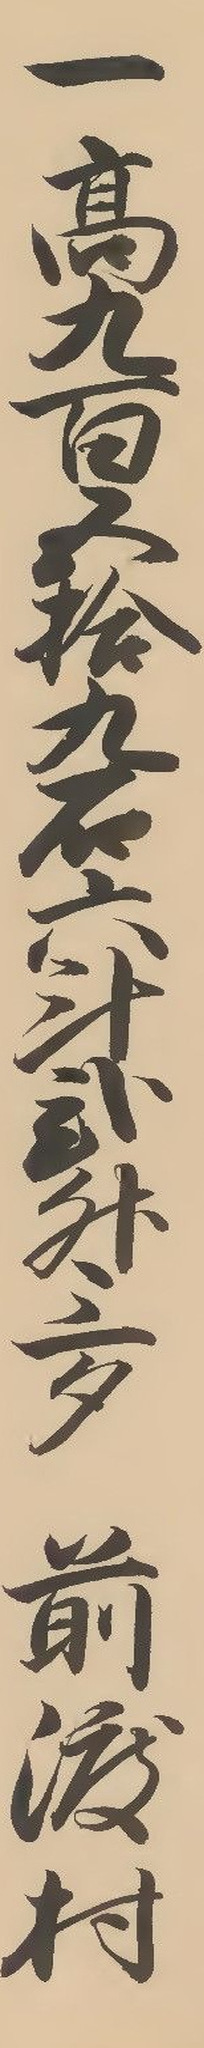一高九百五拾九石六斗弐升三勺前渡村

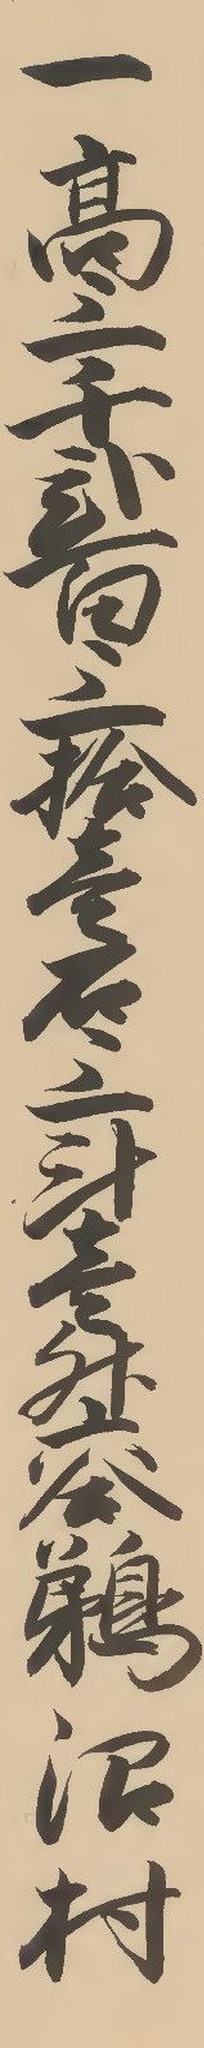一高三千弐百三拾壱石三斗壱升六合鵜沼村
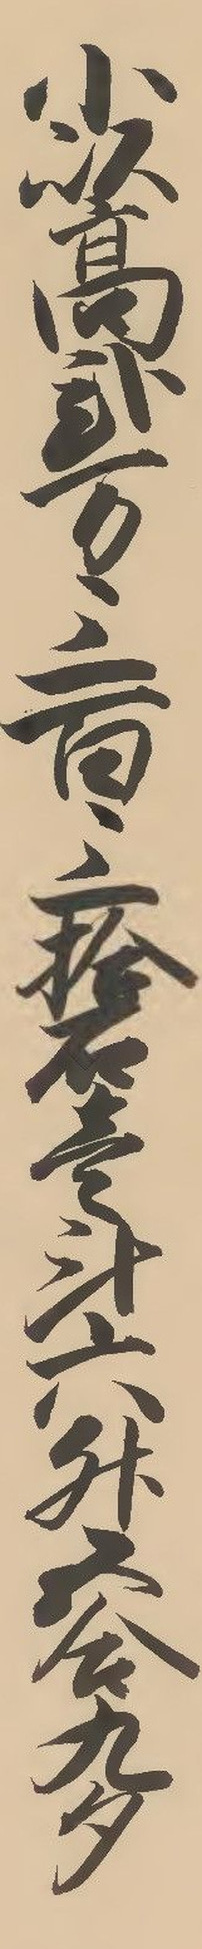小以高弐万三百三拾石壱斗六升五合九勺
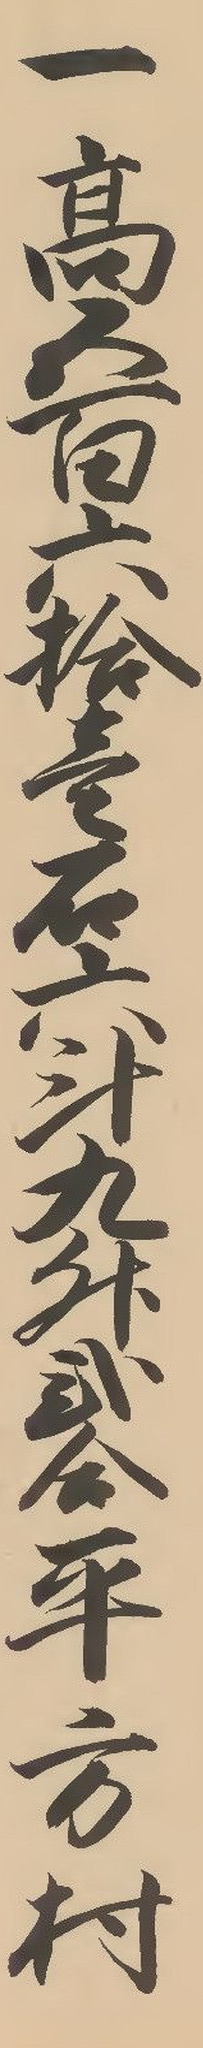一高五百六拾壱石六斗九升弐合平方村
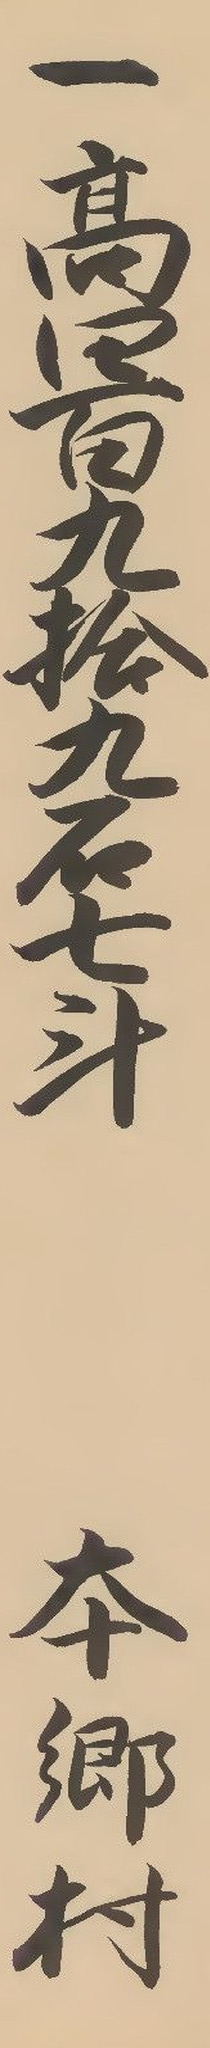一高四百九拾九石七斗本郷村
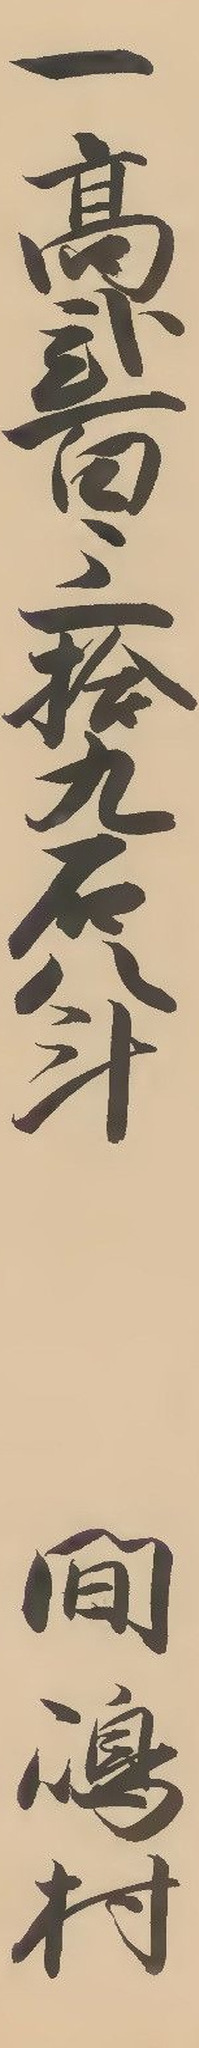一高弐百三拾九石八斗間島村
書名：美濃国郷帳
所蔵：国立公文書館 National Archives of Japan
